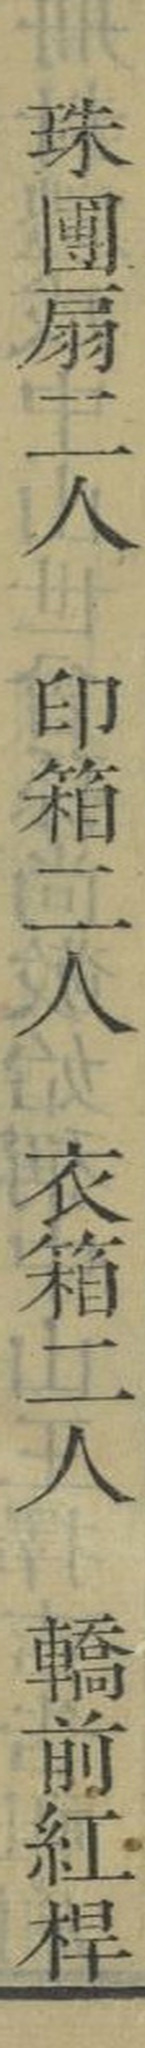珠團扇二人印箱二人衣箱二人轎前紅桿
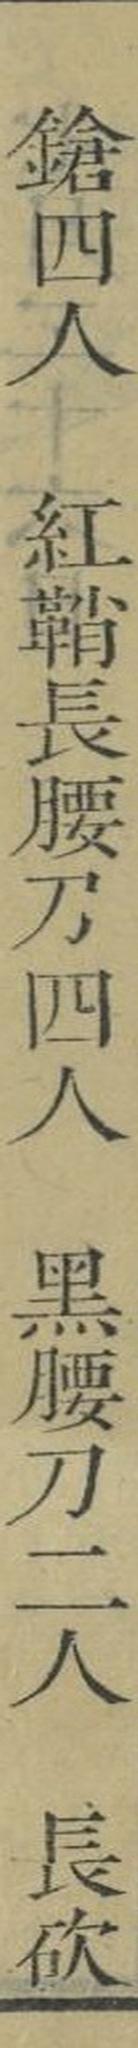鎗四人紅鞘長腰刀四人黑腰刀二人長砍
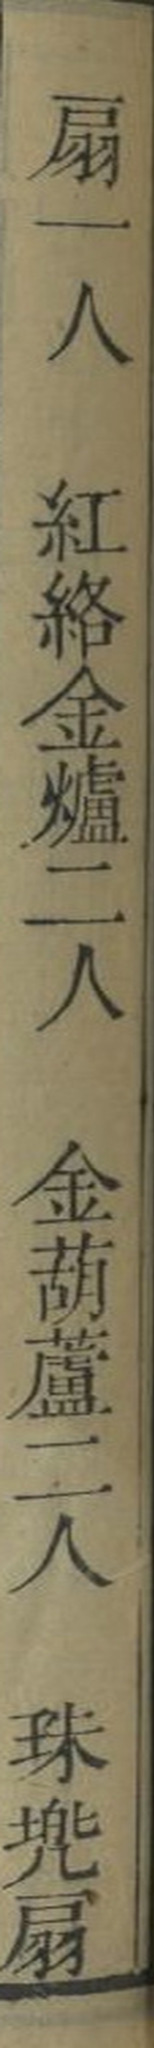扇一人紅絡金爐二人金葫蘆二人珠兠扇
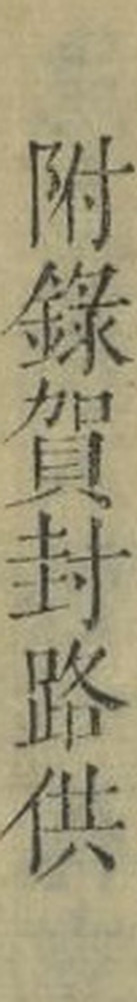附錄賀封路供
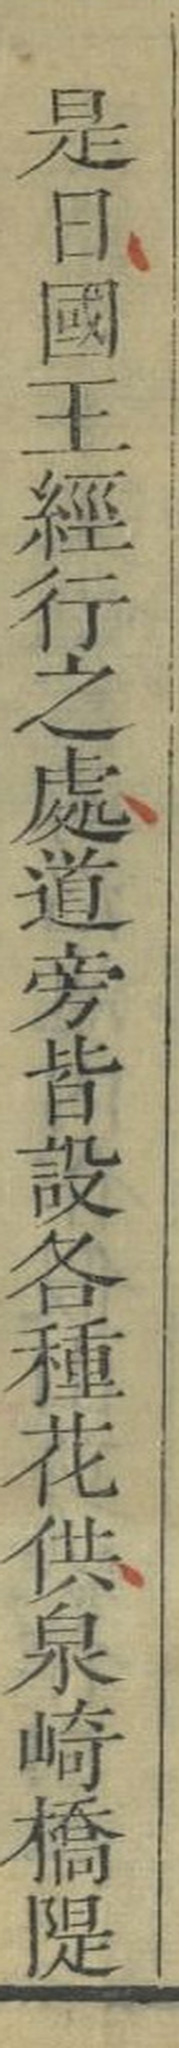是日國王經行之處道旁皆設各種花供泉崎橋隄
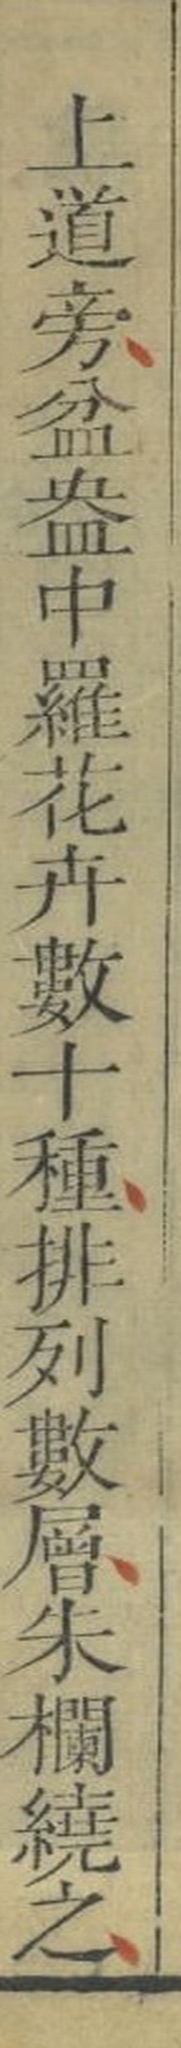上道旁盆盎中羅花卉數十種排列數層朱欄繞之
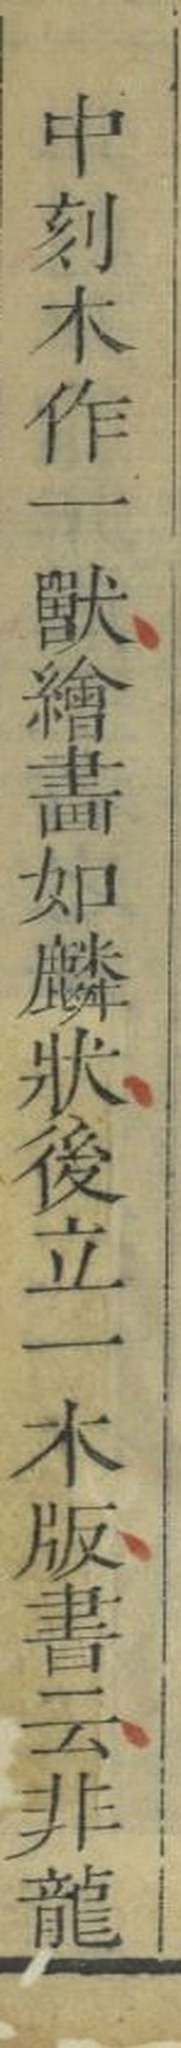中刻木作一獸繪畵如麟狀後立一木版書云非龍

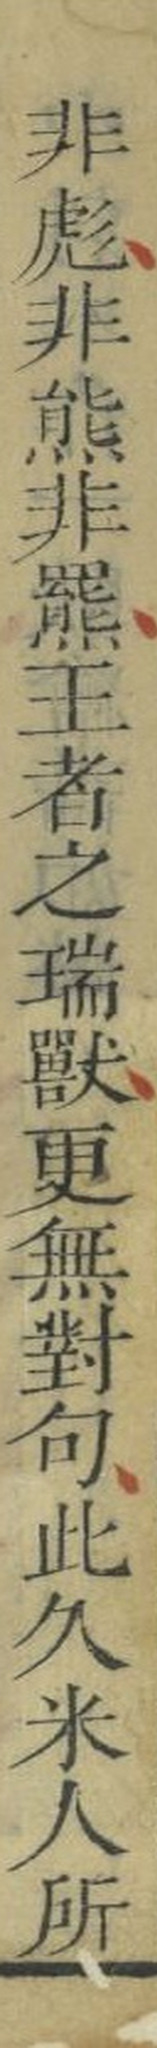非彪非熊非羆王者之瑞獸更無對句此久米人所
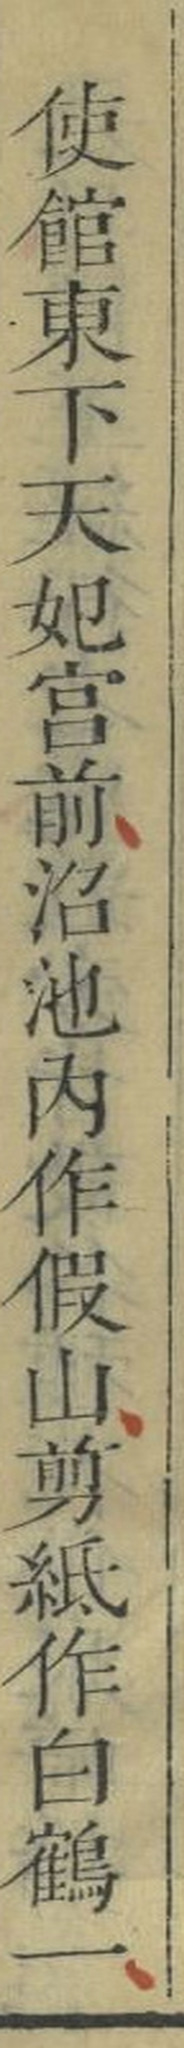使館東下天妃宫前沼池内作假山剪紙作白鶴一
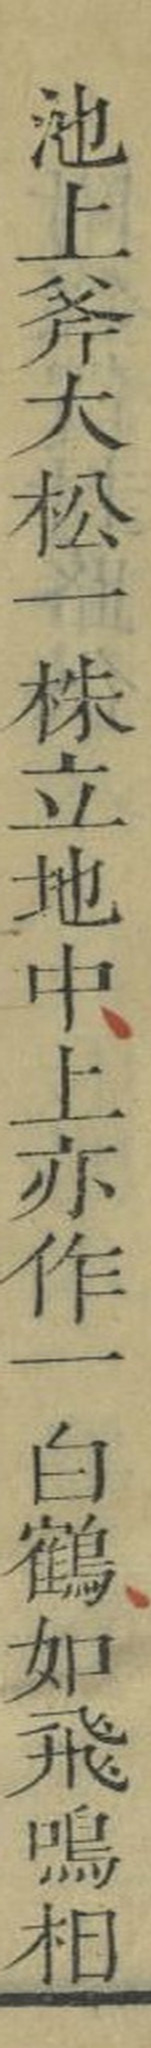池上斧大松一株立地中上亦作一白鶴如飛鳴相
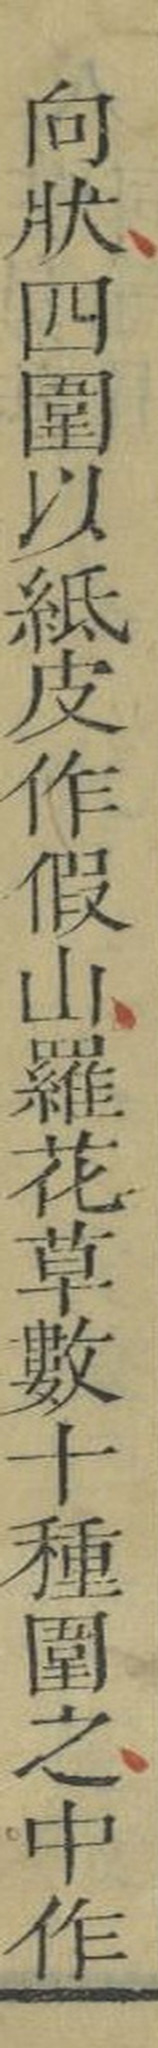向狀四圍以紙皮作假山羅花草數十種圍之中作
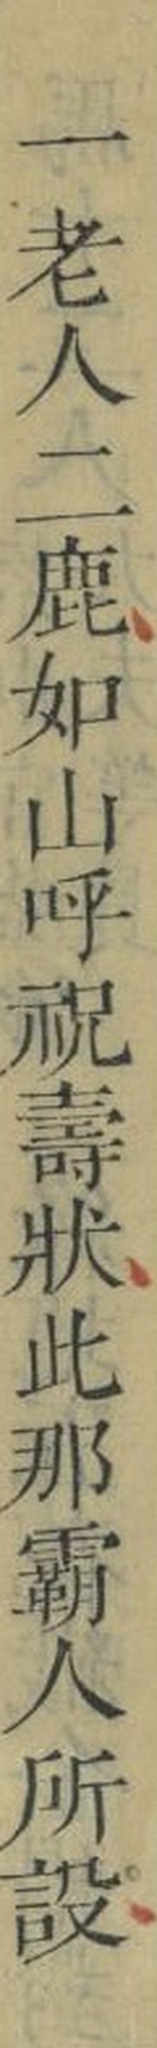一老人二鹿如山呼祝壽狀此那霸人所設
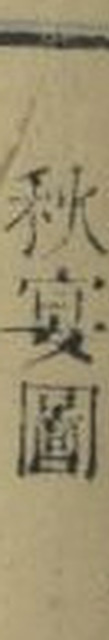秋宴圖

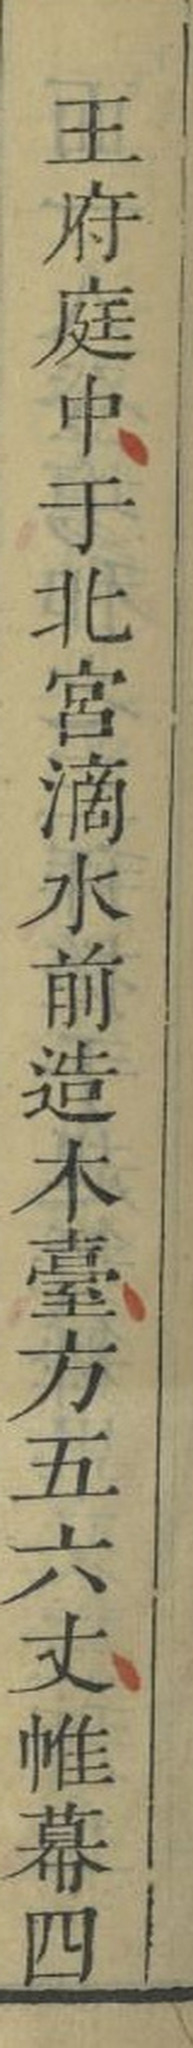王府庭中于北宮滴水前造木臺方五六丈帷幕四
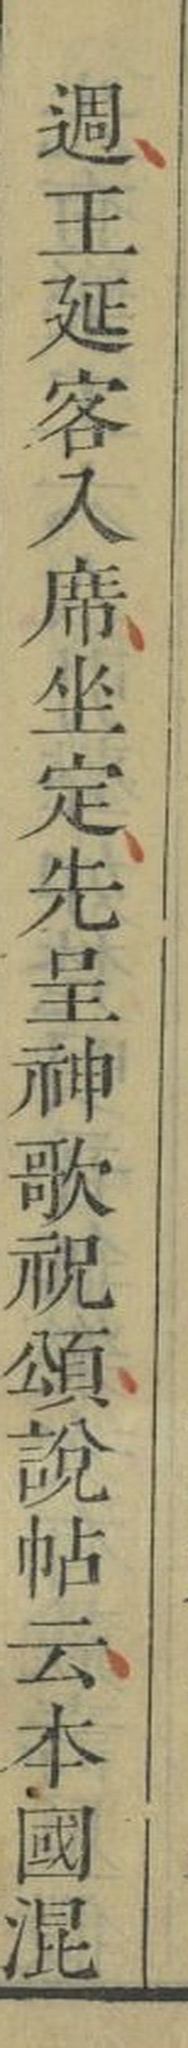週王延客入席坐定先呈神歌祝頌説帖云本國混
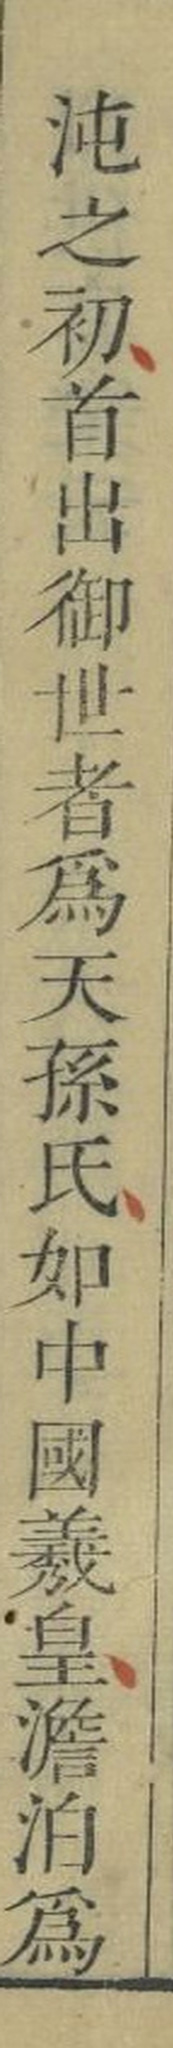沌之初首出御世者爲天孫氏如中國羲皇澹泊爲
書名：中山伝信録 巻一、巻二
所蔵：University of the Ryukyus Library
